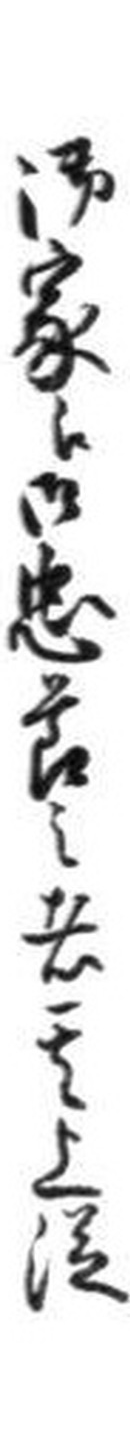御家江御忠節之者其上従
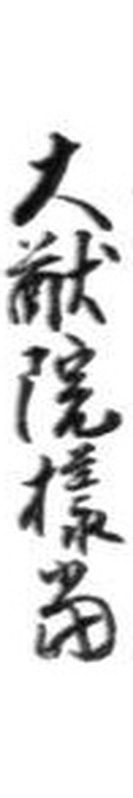大猷院様当
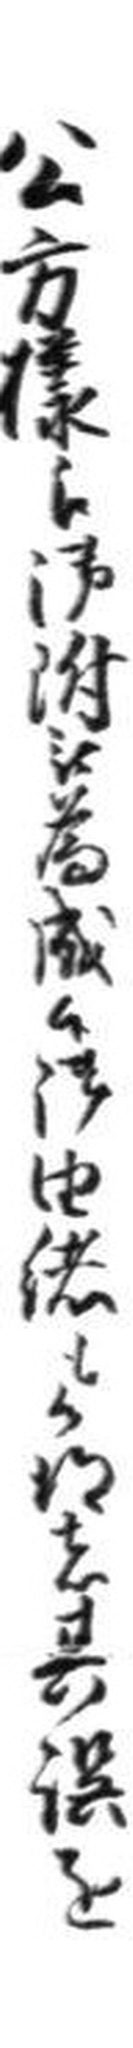公方様江御附被為成候御由緒も候得者其誤を
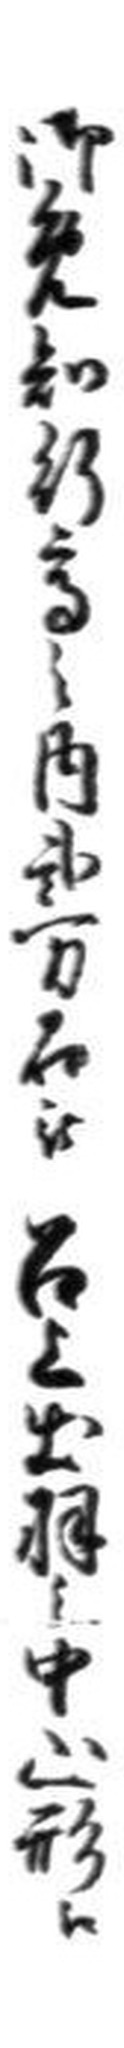御免知行高之内弐万石被召上出羽之中山形江
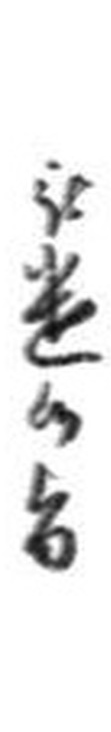被遣候旨
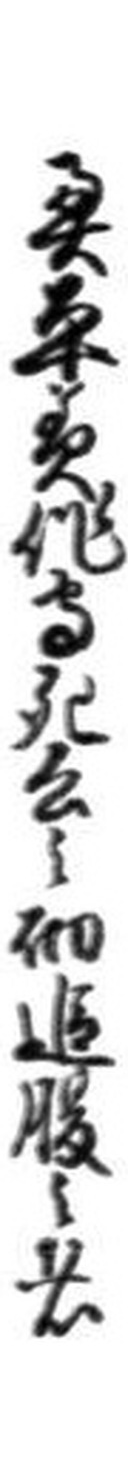奥平美作守死去之砌追腹之者
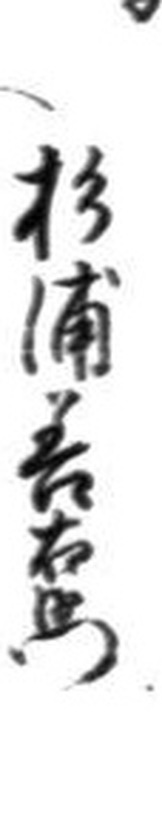杉浦善右衛門
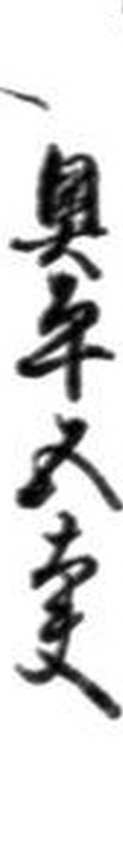奥平五太夫
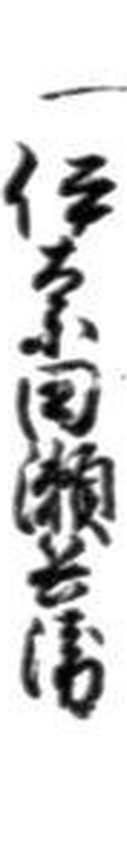伊奈田瀬兵衛
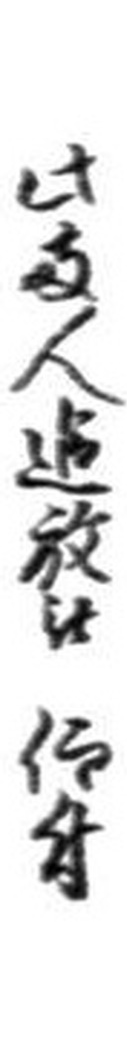此両人追放被仰付

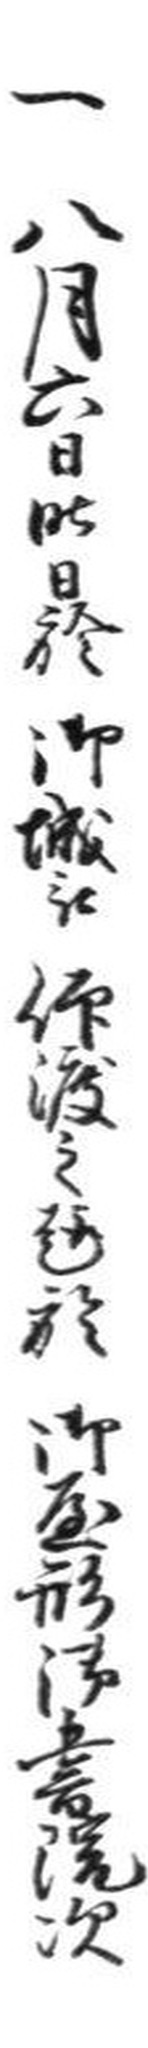一八月六日昨日於御城被仰渡之趣於御屋形御書院次
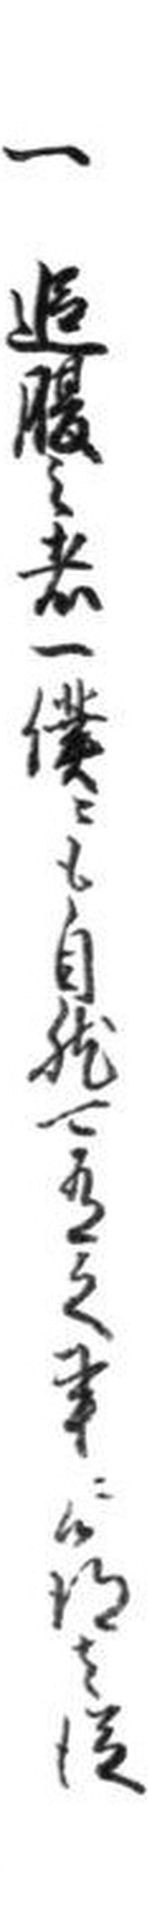一追腹之者一僕ニも自然可有之事ニ候得者従
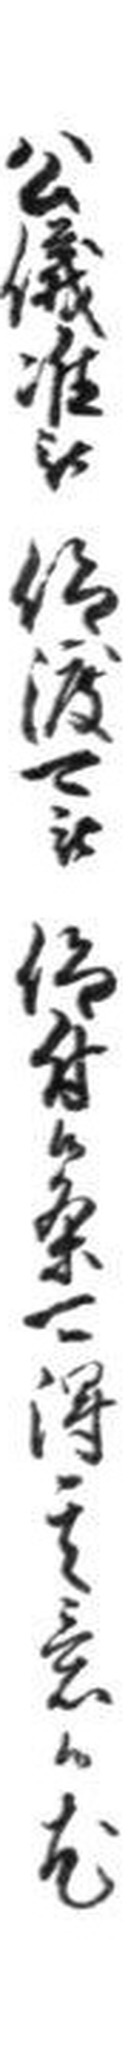公儀准被仰渡可被仰付候条可得其意候尤
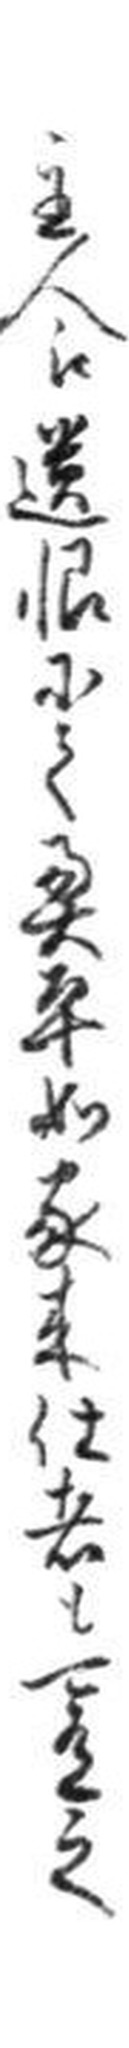主人江遺恨にて奥平如家来仕者も可有之
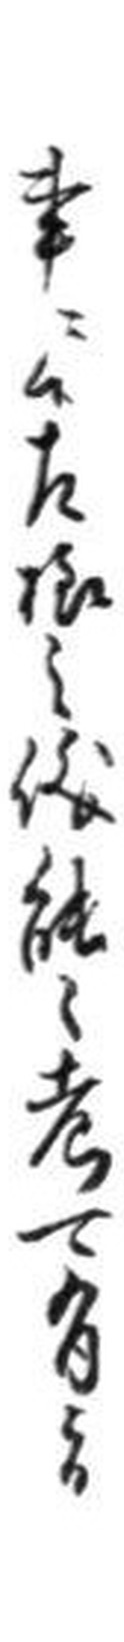事ニ候左様之儀能々考可有旨
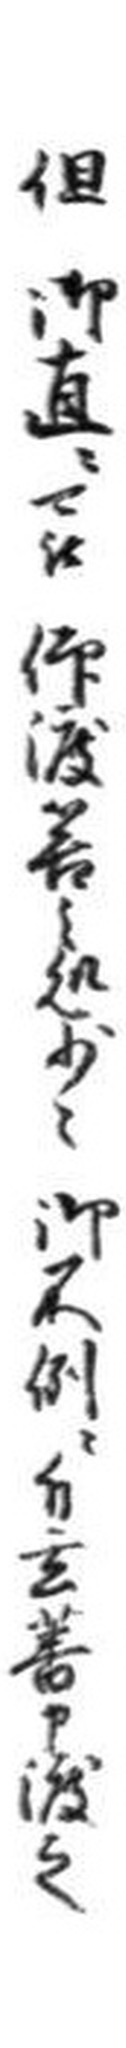但御直ニ可被仰渡筈之処少々御不例ニ付玄蕃申渡之
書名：家譜 七 光通公 従寛文四年到同九年
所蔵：福井県文書館 Fukui Prefectural Archives
